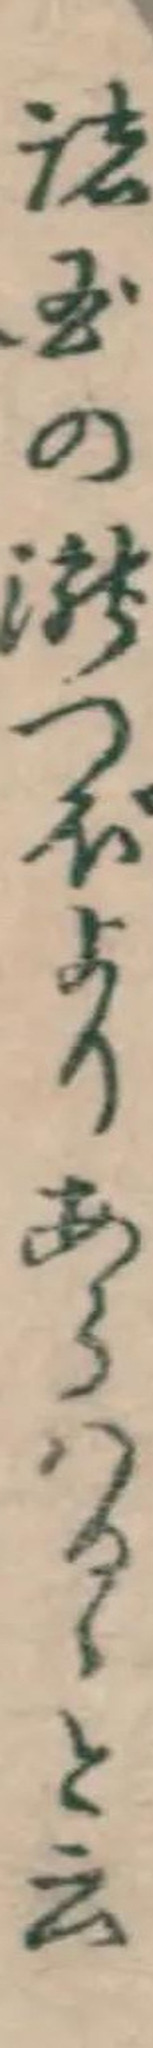諸国の滝つぼよりあらはるゝと云
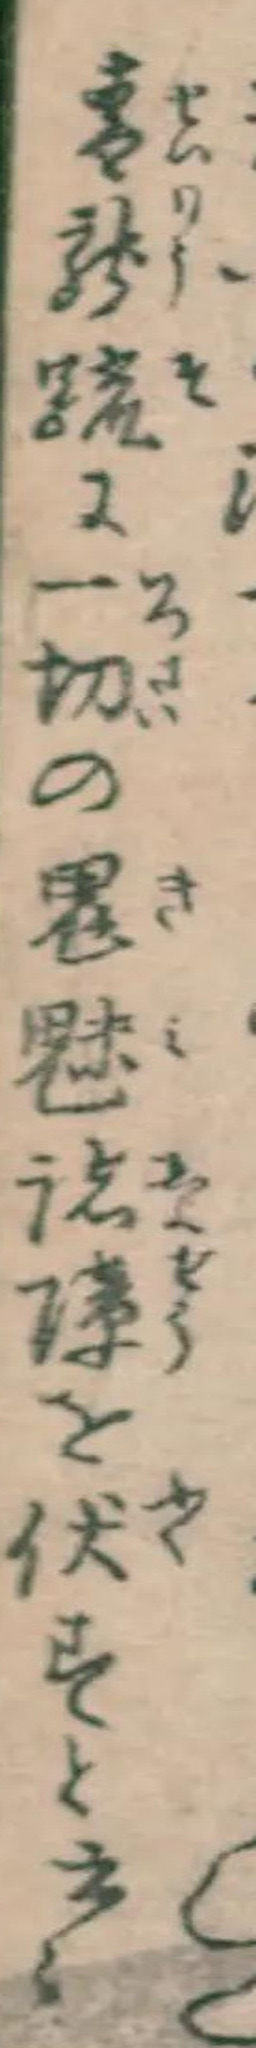青龍疏に一切の鬼魅諸障を伏すと云々
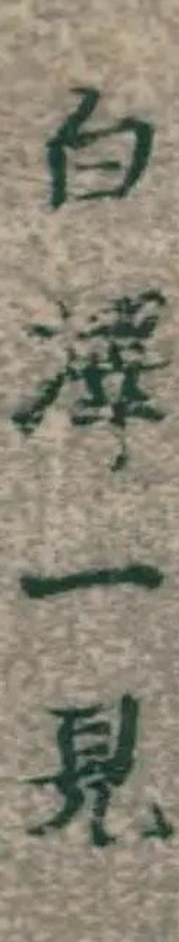白澤一見
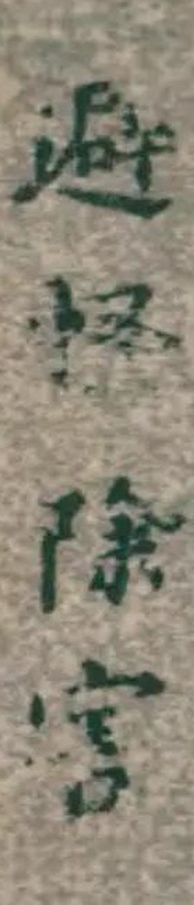避怪除害
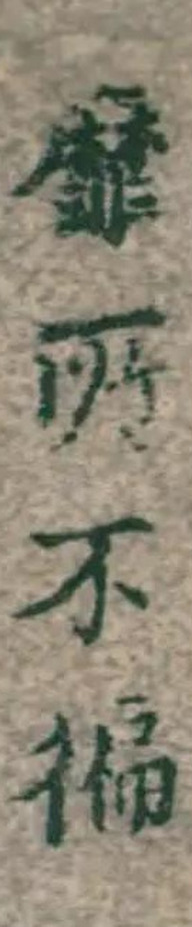靡所不徧
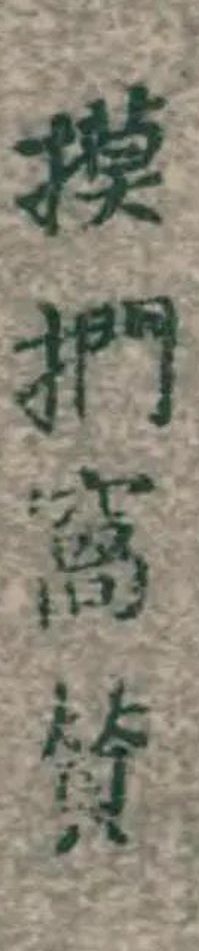摸捫窩賛

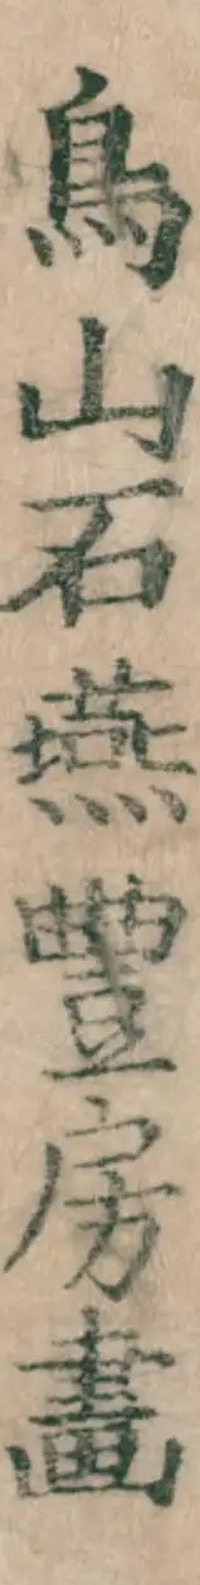鳥山石燕豊房画
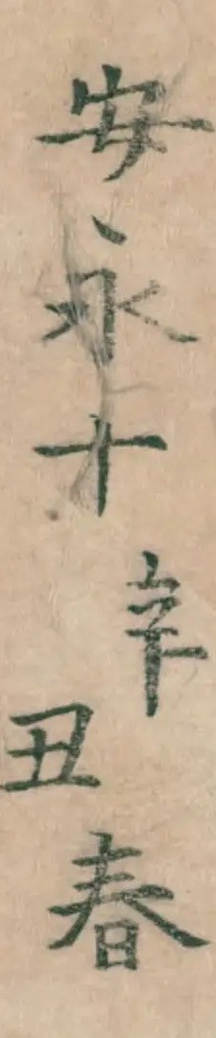安永十辛丑春
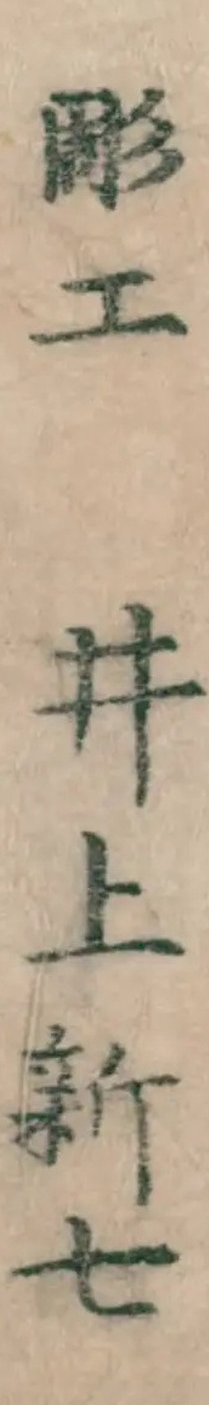彫工井上新七
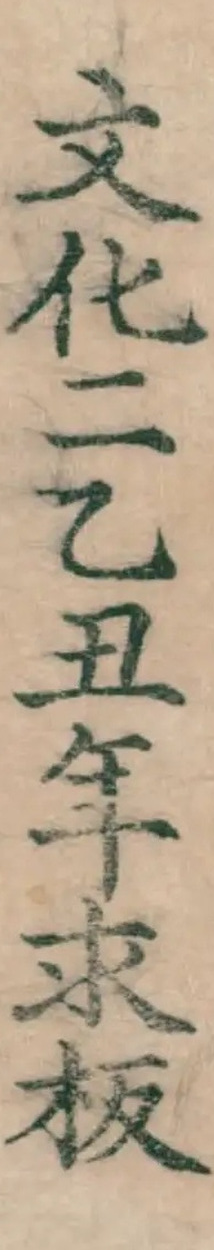文化二乙丑求板
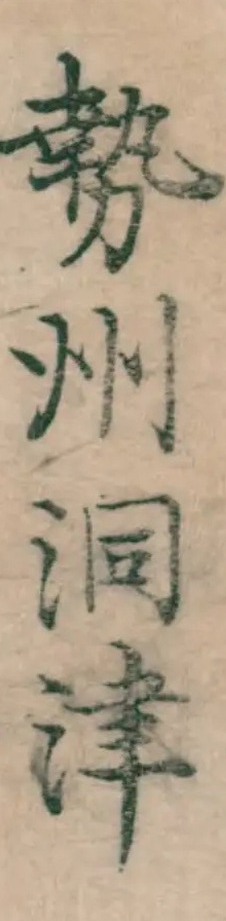勢州洞津
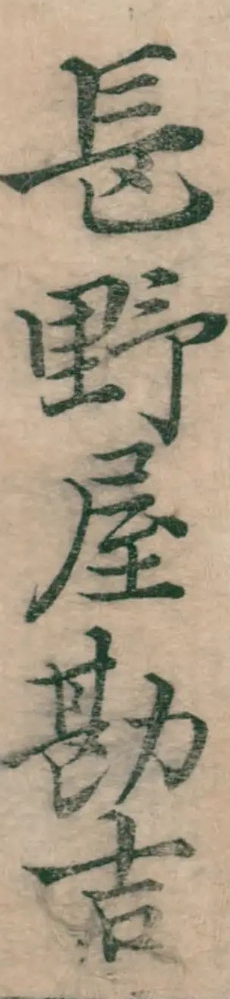長野屋勘助
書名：百鬼夜行 3巻拾遺3巻. [2]
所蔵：国立国会図書館 National Diet Library, JAPAN
